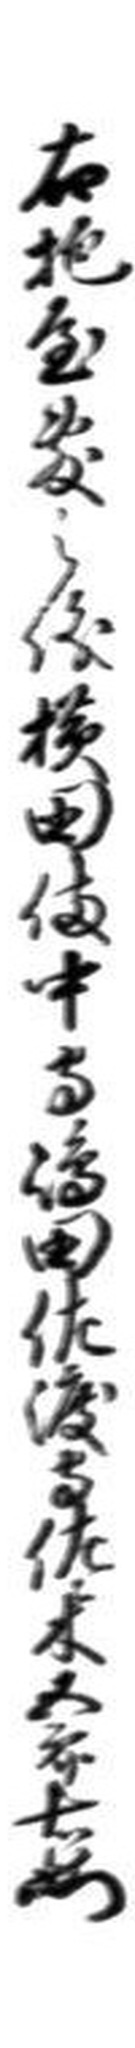右抱屋敷之儀横田備中守嶋田佐渡守佐々木五郎右衛門
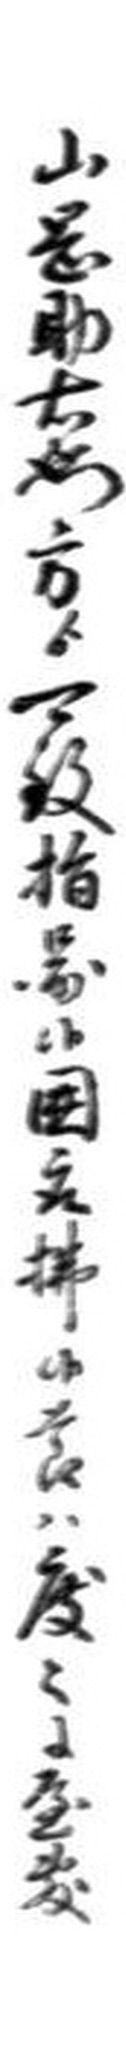山岡助右衛門方ゟ可致指図候囲取払候節ハ度々に屋敷
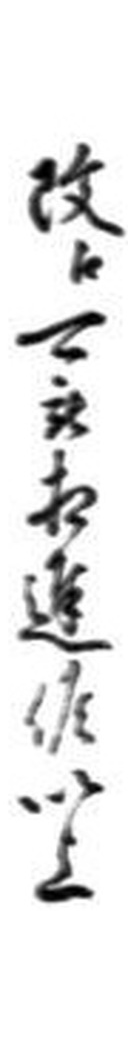改江可被相達候以上
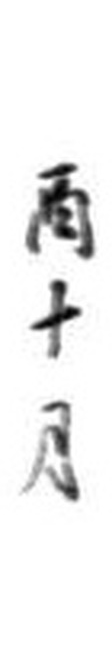酉十月

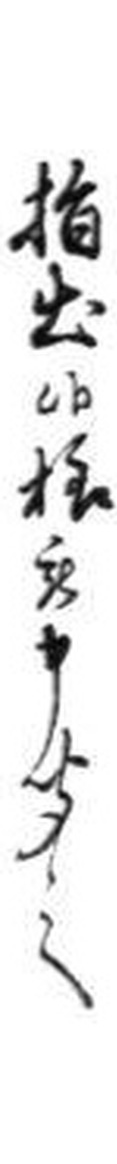指出候様被申聞之
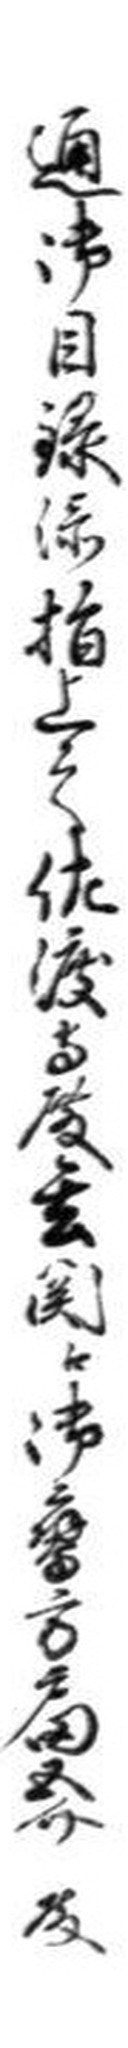通御目録添指上之佐渡守殿玄関江御鷹方戸田五介殿
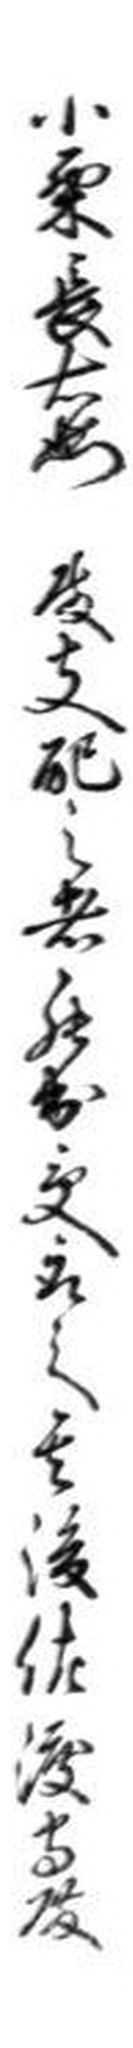小栗長右衛門殿支配之者罷出受取之其後佐渡守殿
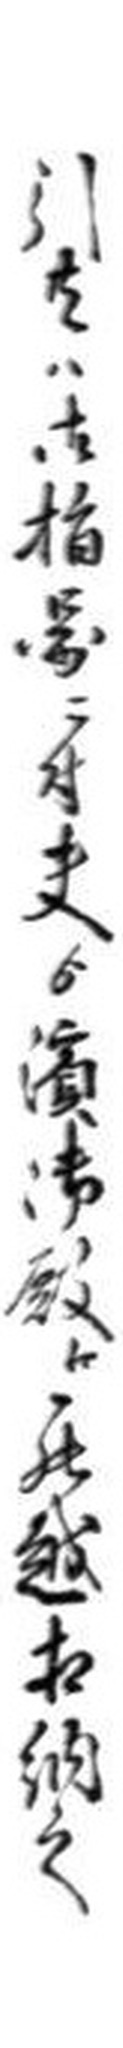引共ハ御指図ニ付夫ゟ浜御殿江罷越相納之
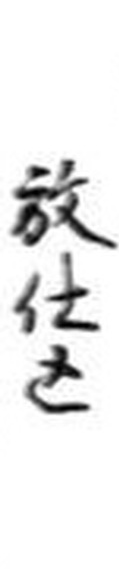放仕込
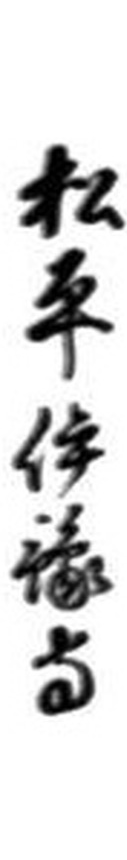松平伊予守
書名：家譜 三十二 吉邦公 従享保二年到享保三年
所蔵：福井県文書館 Fukui Prefectural Archives
